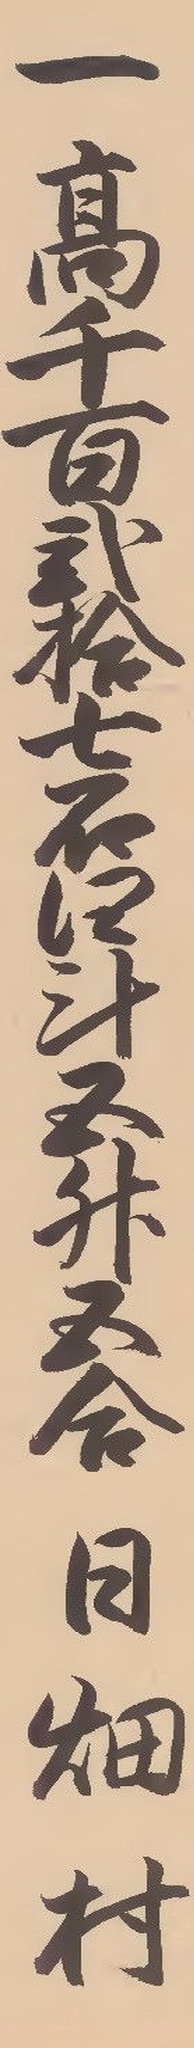一高千百弐拾七石四斗五升五合日畑村
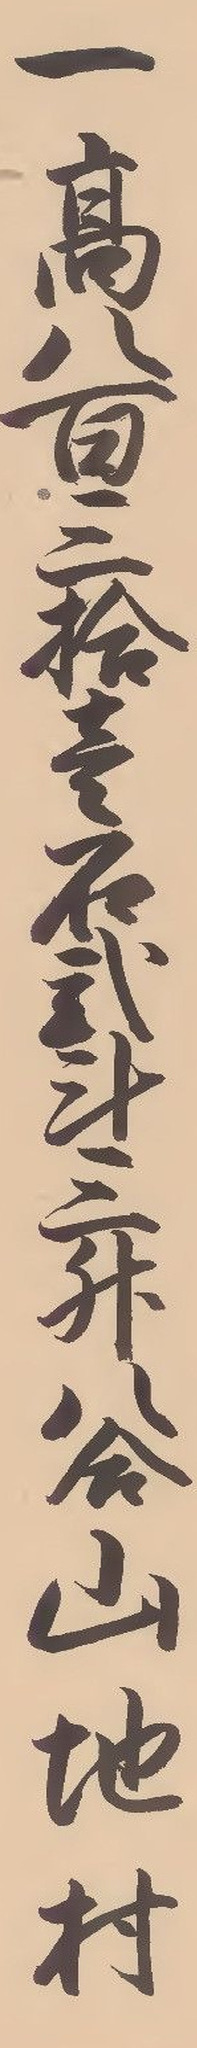一高八百三拾壱石弐斗三升八合山地村

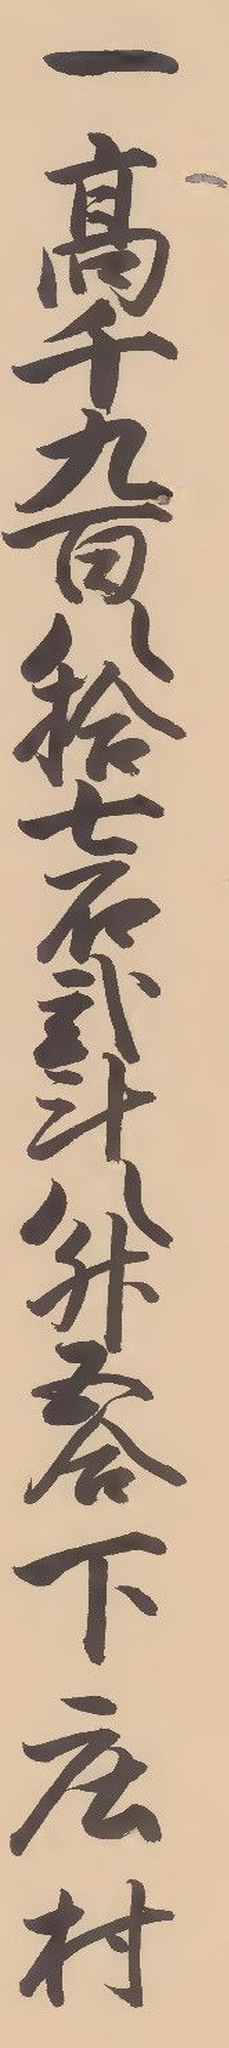一高千九百八拾七石弐斗八升五合下庄村
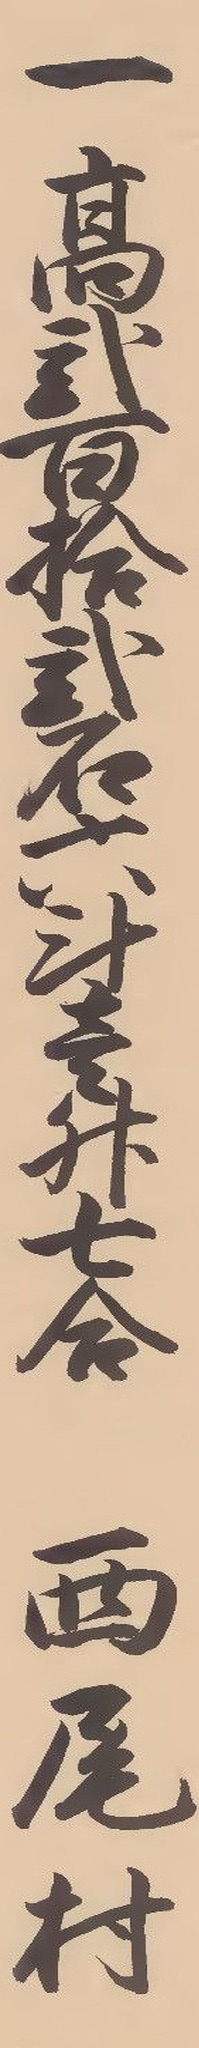一高弐百拾弐石六斗壱升七合西尾村
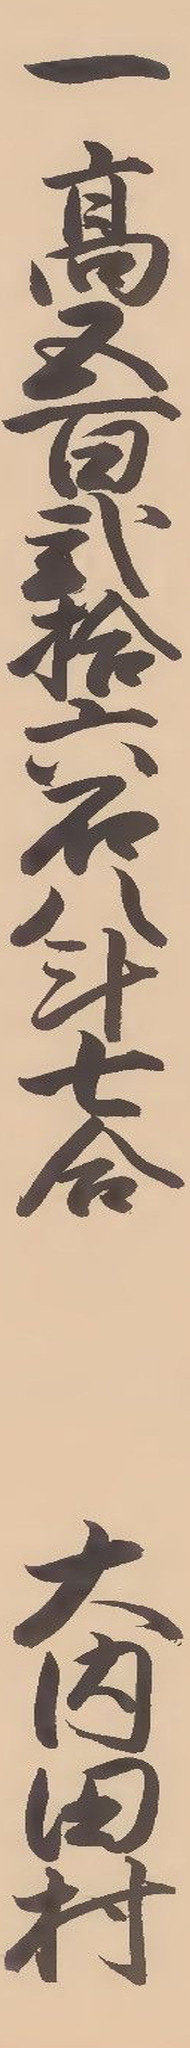一高五百弐拾六石八斗七合大内田村
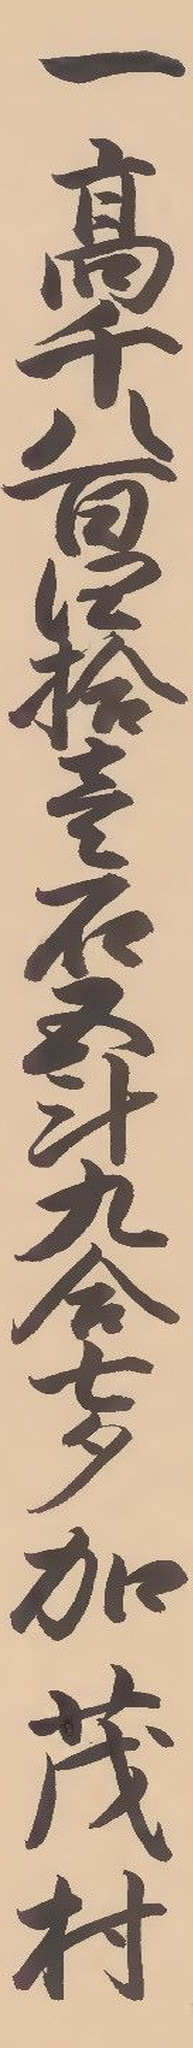一高千八百四拾壱石五斗九合七勺加茂村
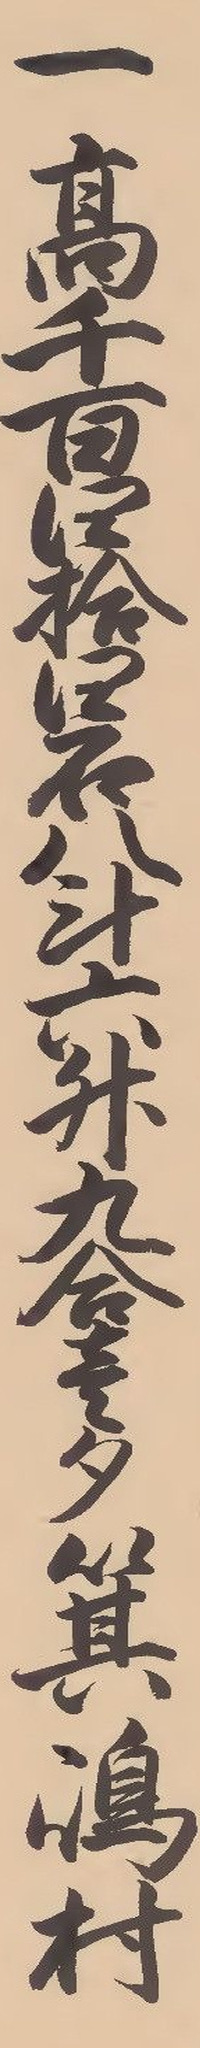一高千百四拾四石八斗六升九合壱勺箕島村
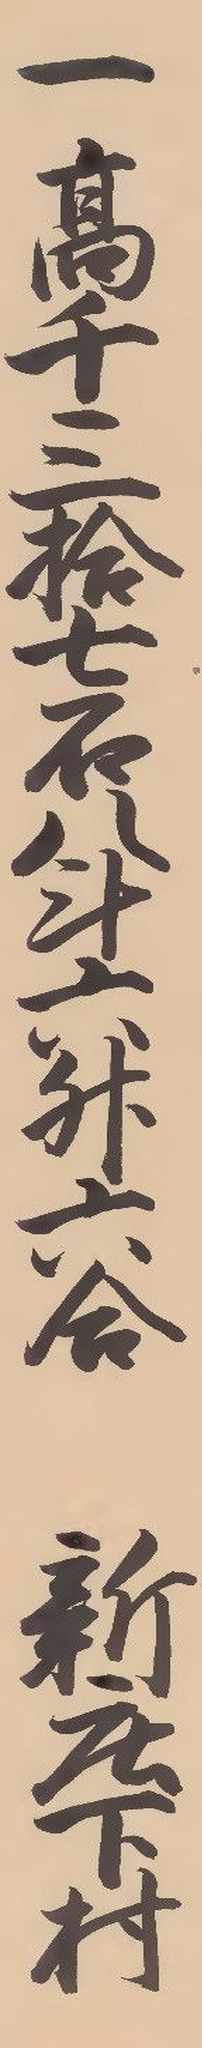一高千三拾七石八斗六升六合新庄下村
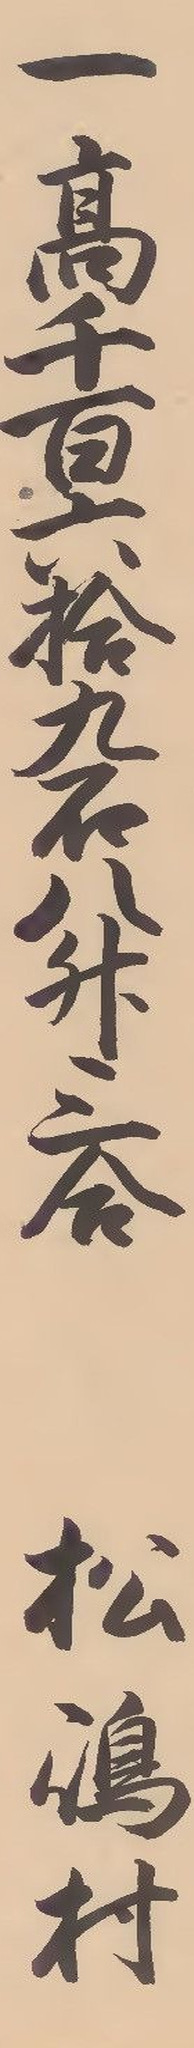一高千百六拾九石八升三合松島村

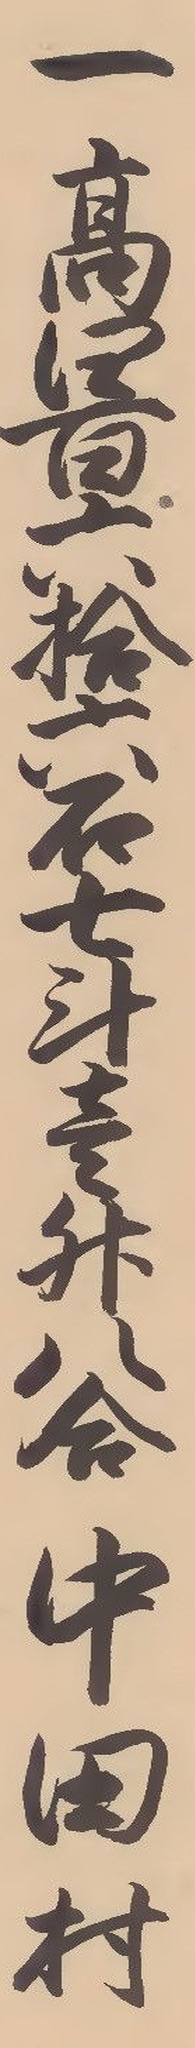一高四百六拾六石七斗壱升八合中田村
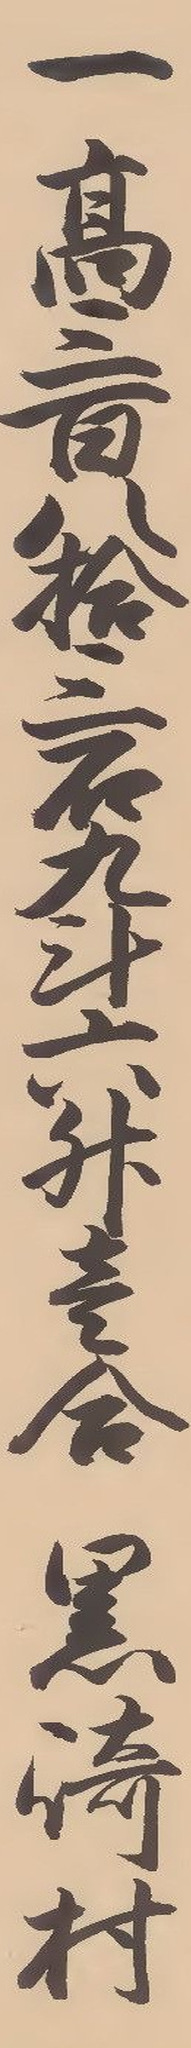一高三百八拾三石九斗六升壱合黒崎村
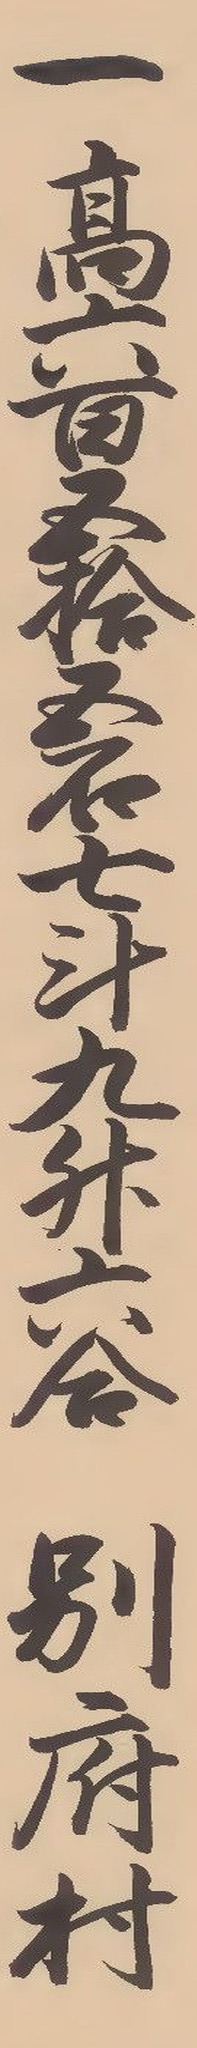一高六百五拾五石七斗九升六合別府村
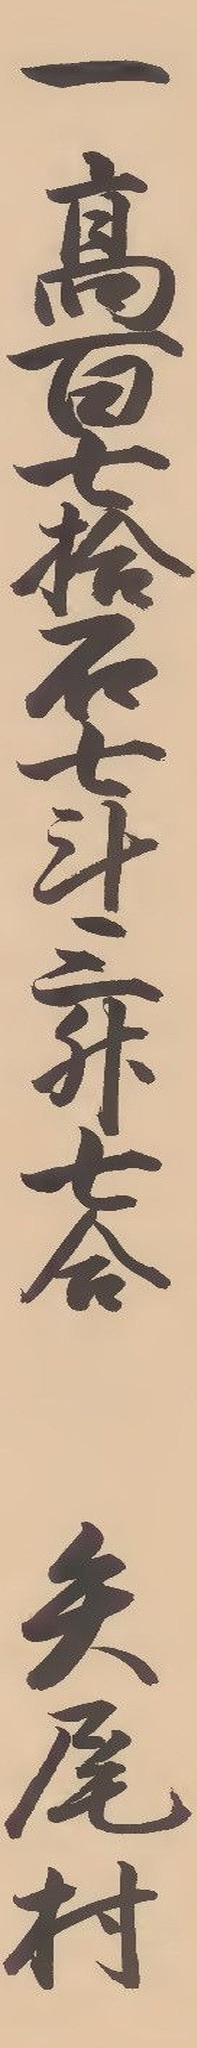一高百七拾石七斗三升七合矢尾村
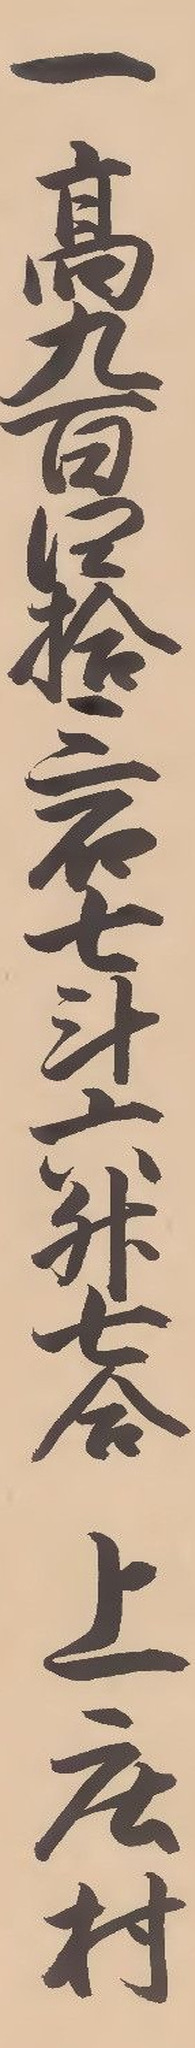一高九百四拾三石七斗六升七合上庄村
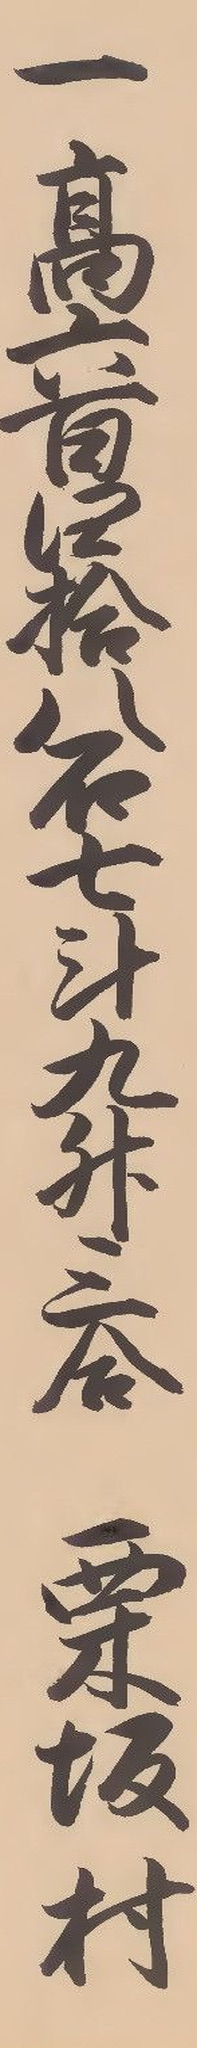一高六百四拾八石七斗九升三合栗坂村
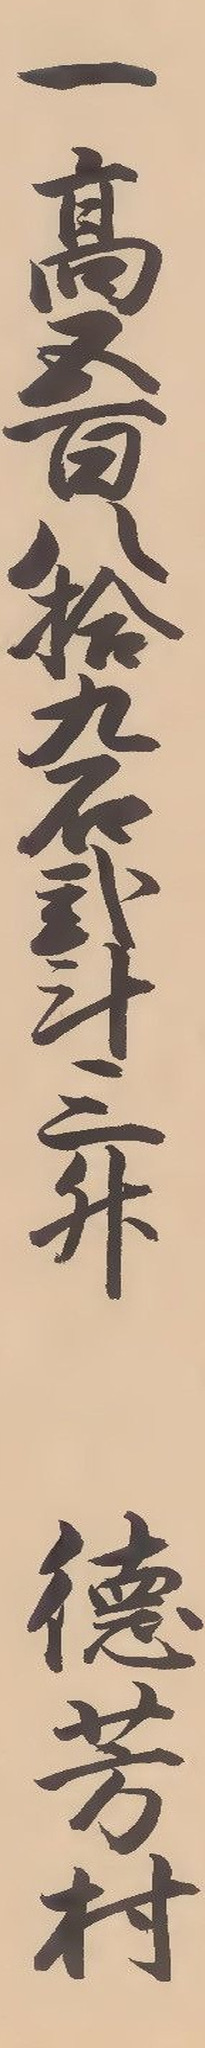一高五百八拾九石弐斗三升徳芳村
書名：備中国郷帳
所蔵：国立公文書館 National Archives of Japan
